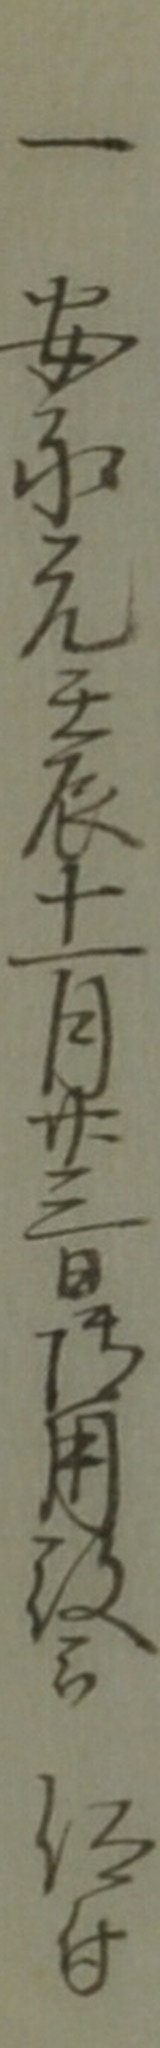一安永元壬辰十一月廿三日御用役被仰付
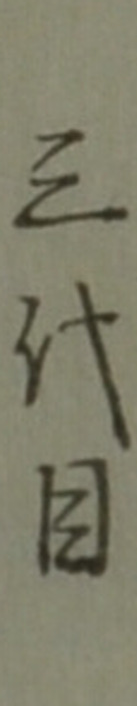三代目
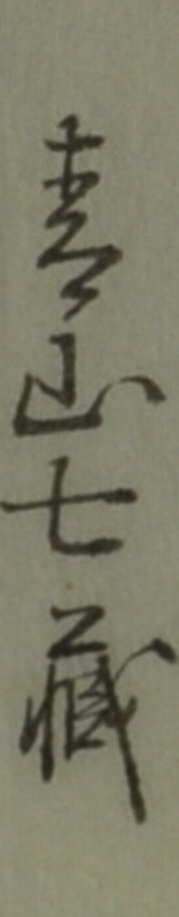青山七蔵
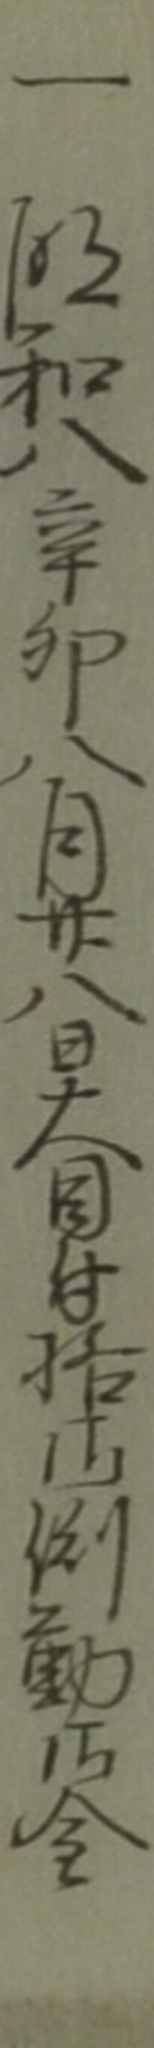一明和八辛卯八月廿八日大目付格御側勤御金
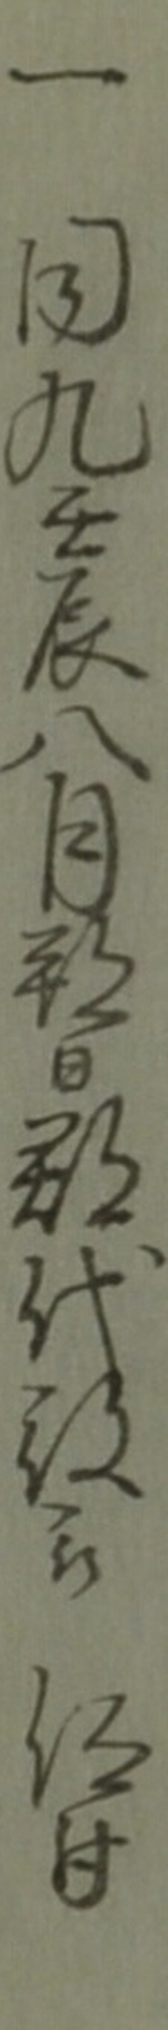一同九壬辰八月朔日郡代役被仰付
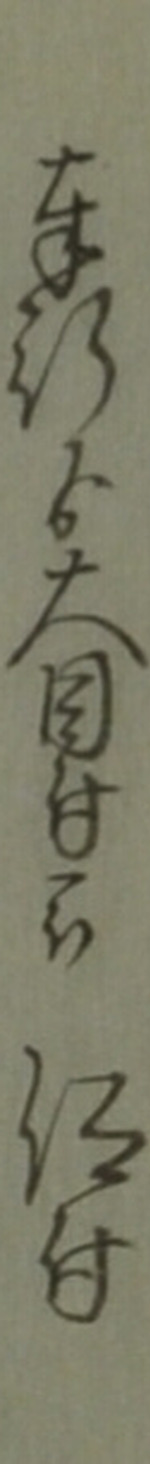奉行ゟ大目付被仰付
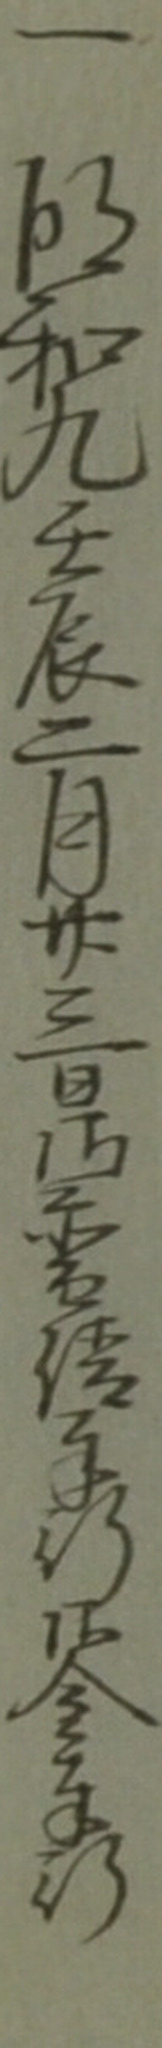一明和九壬辰二月廿三日御普請奉行御金奉行
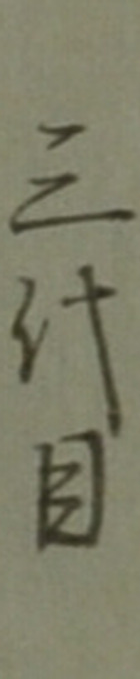三代目
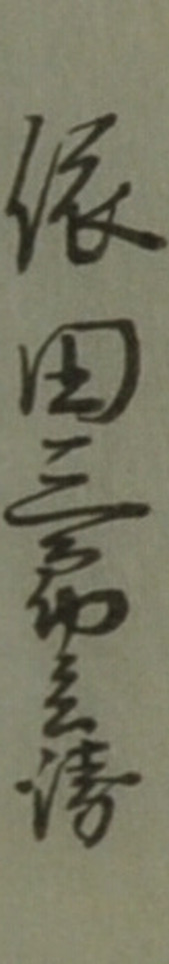依田三郎兵衛
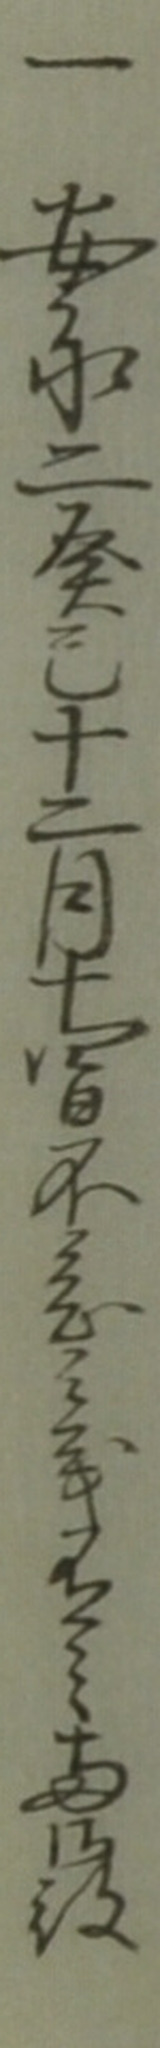一安永二癸巳十二月十四日不念之義有之両御役
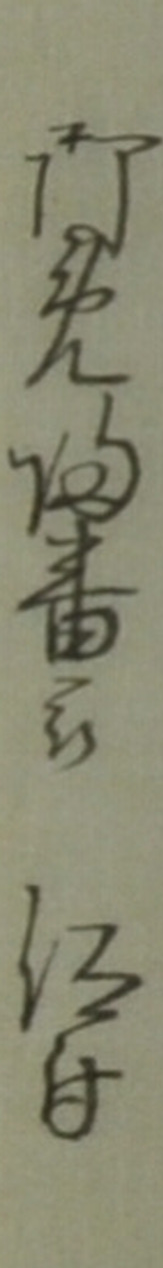御免帰番被仰付
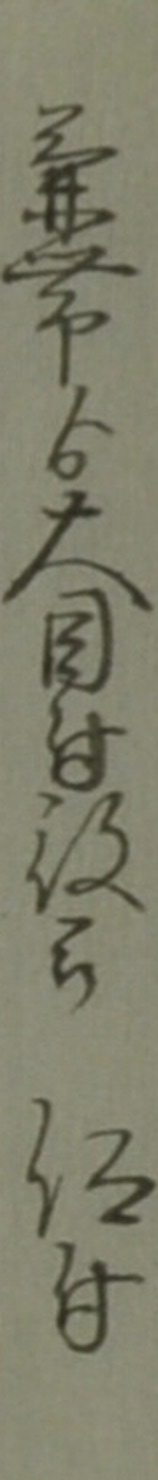兼帯ゟ大目付役被仰付

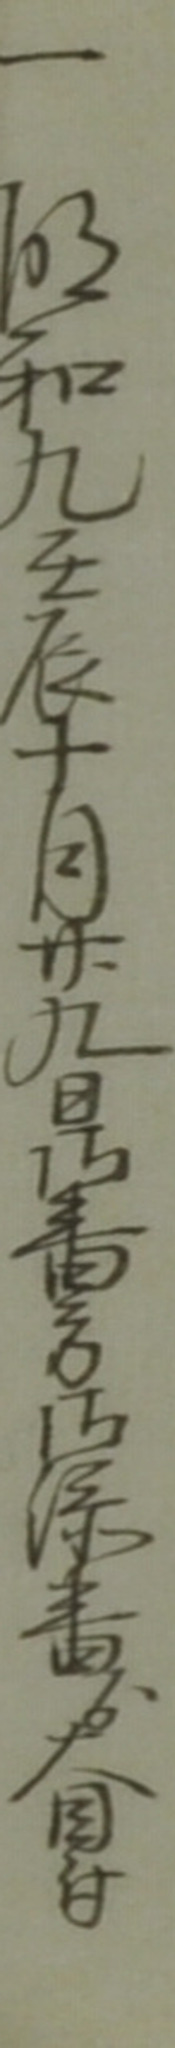一明和九壬辰十月廿九日御番方御添番ゟ大目付
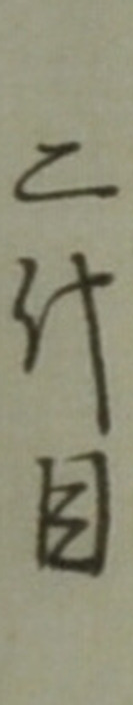二代目
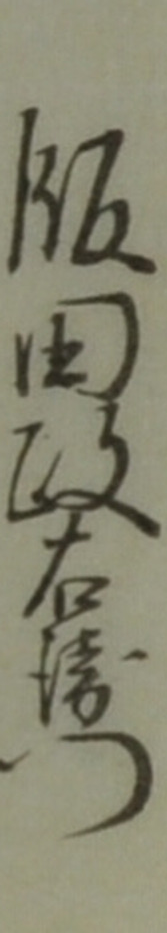飯田政右衛門
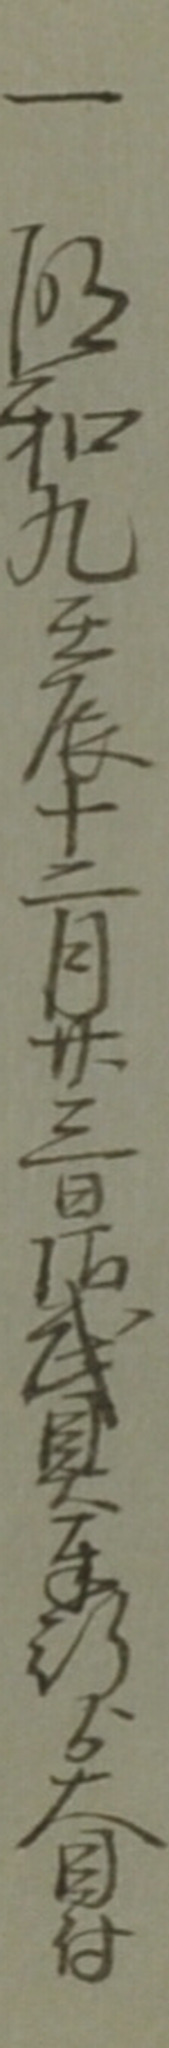一明和九壬辰十二月廿三日御武具奉行ゟ大目付
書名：諸御役代々録（三）
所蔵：伊那市立高遠町図書館・合同会社AMANE
